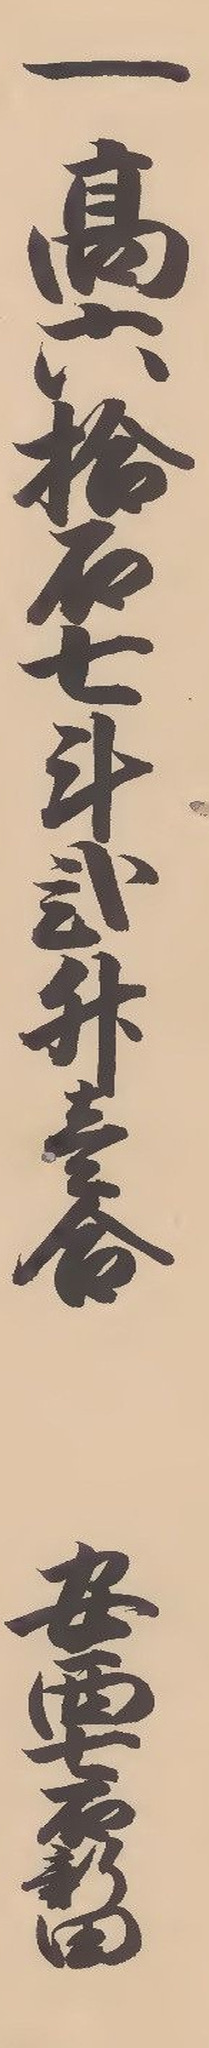一高六拾石七斗弐升壱合安西七石新田
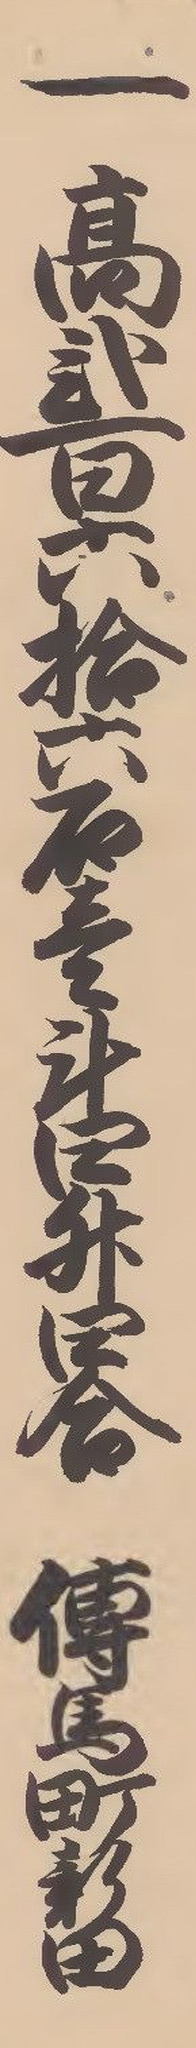一高弐百六拾六石壱斗四升四合伝馬町新田
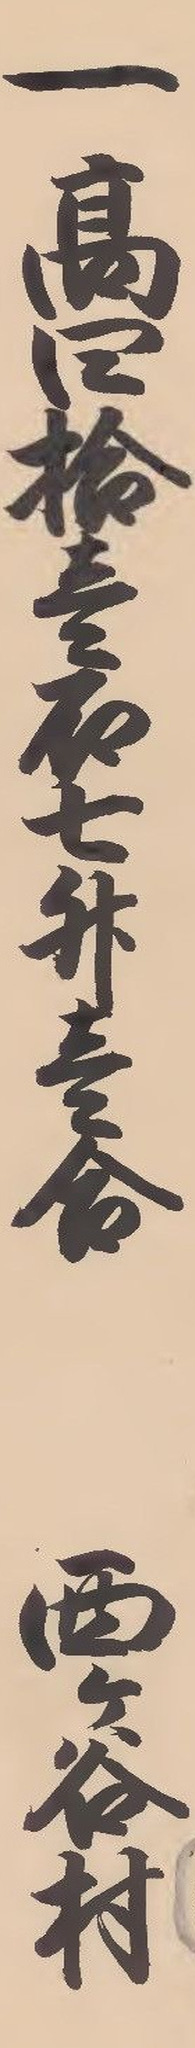一高四拾壱石七升壱合西ヶ谷村
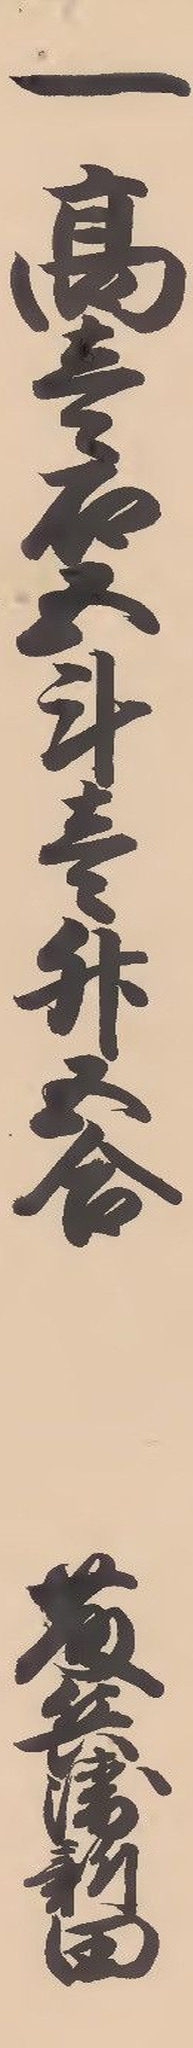一高壱石五斗壱升五合藤兵衛新田
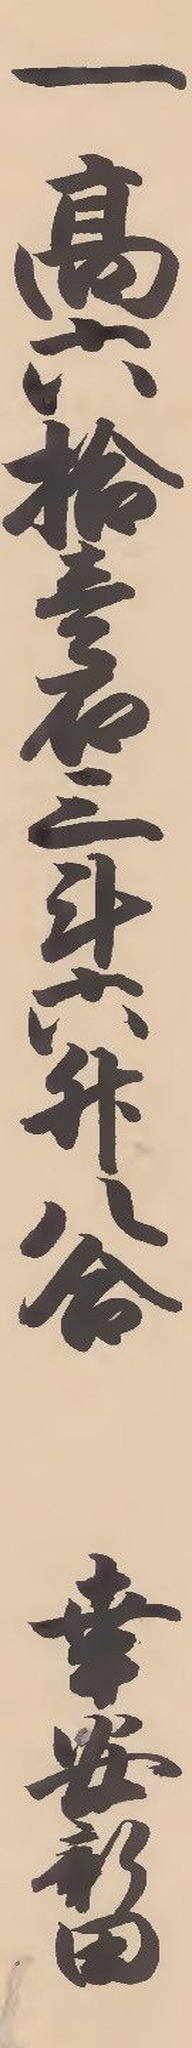一高六拾壱石三斗六升八合幸安新田
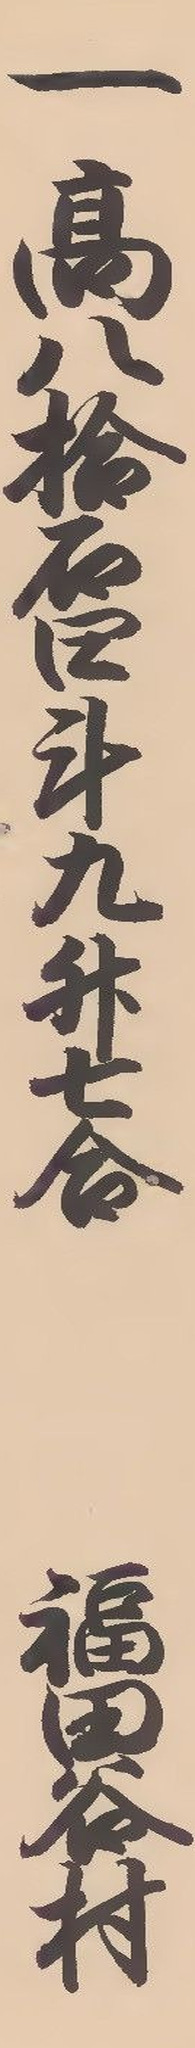一高八拾石四斗九升七合福田谷村

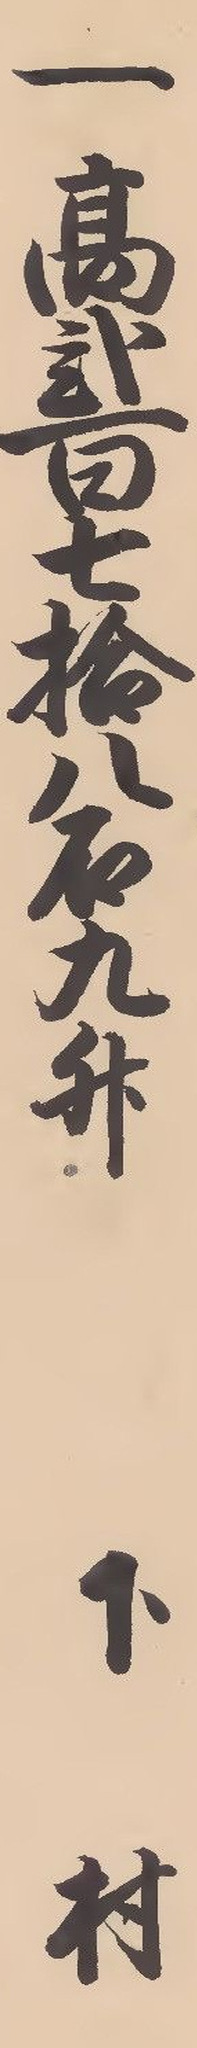一高弐百七拾八石九升下村
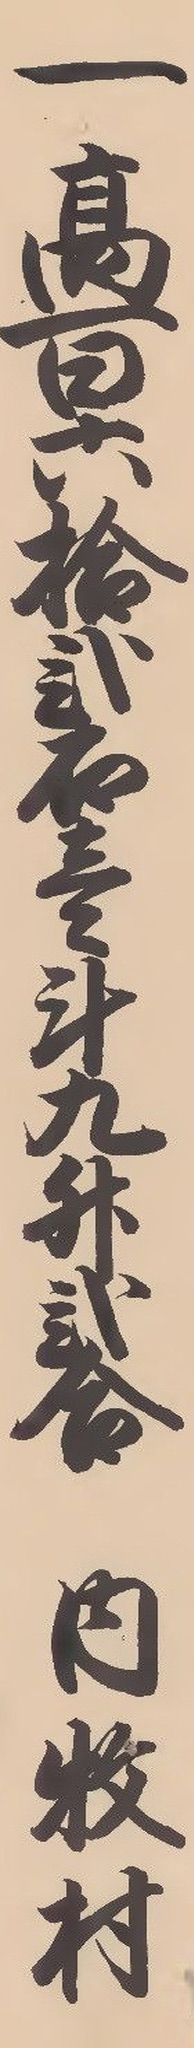一高百六拾弐石壱斗九升弐合内牧村
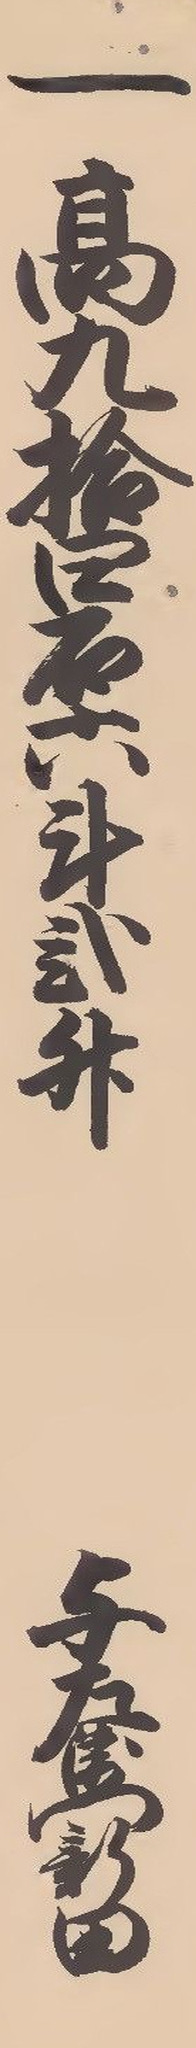一高九拾四石六斗弐升与左衛門新田
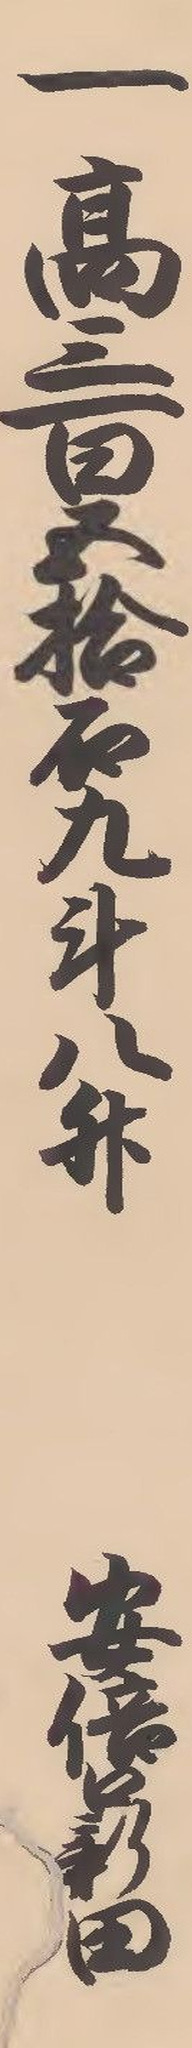一高三百五拾石九斗八升安倍口新田
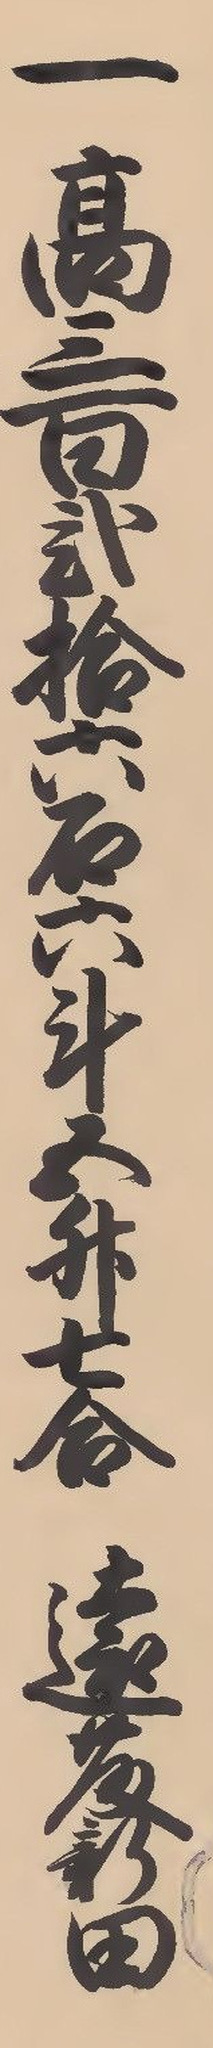一高三百弐拾六石六斗五升七合遠藤新田
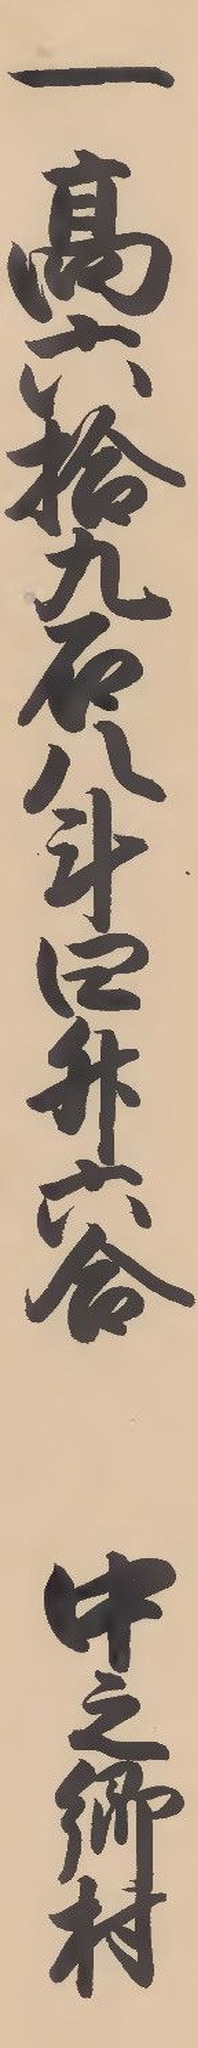一高六拾九石八斗四升六合中之郷村
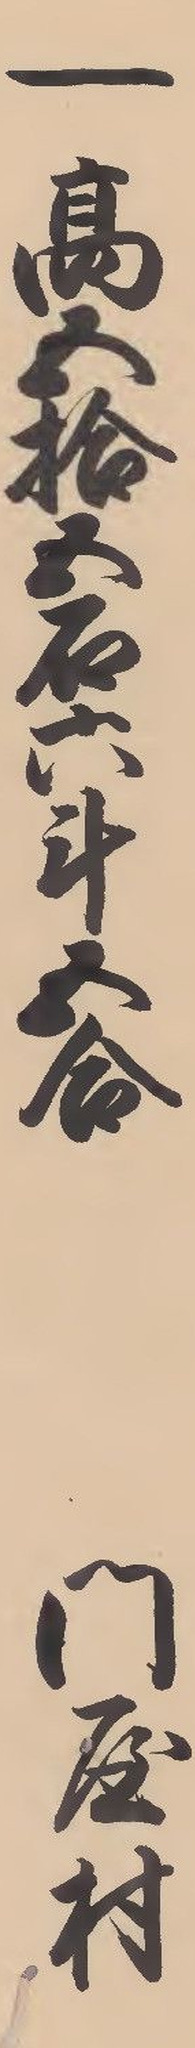一高五拾五石六斗五合門屋村
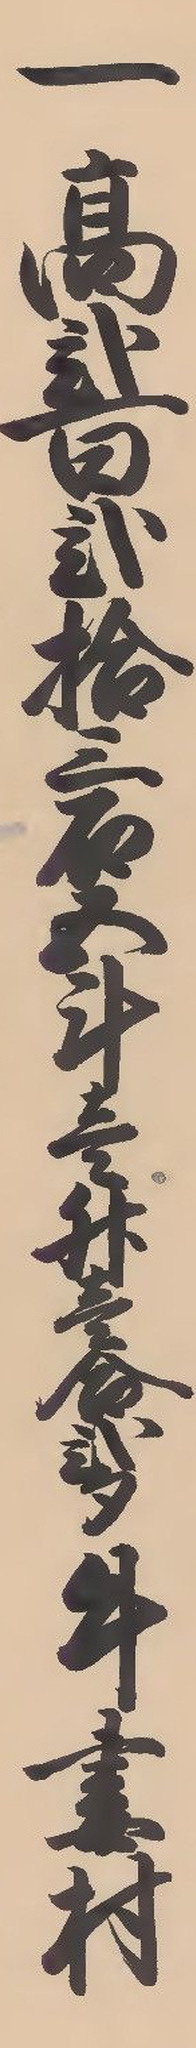一高弐百弐拾三石五斗壱升壱合弐勺牛妻村

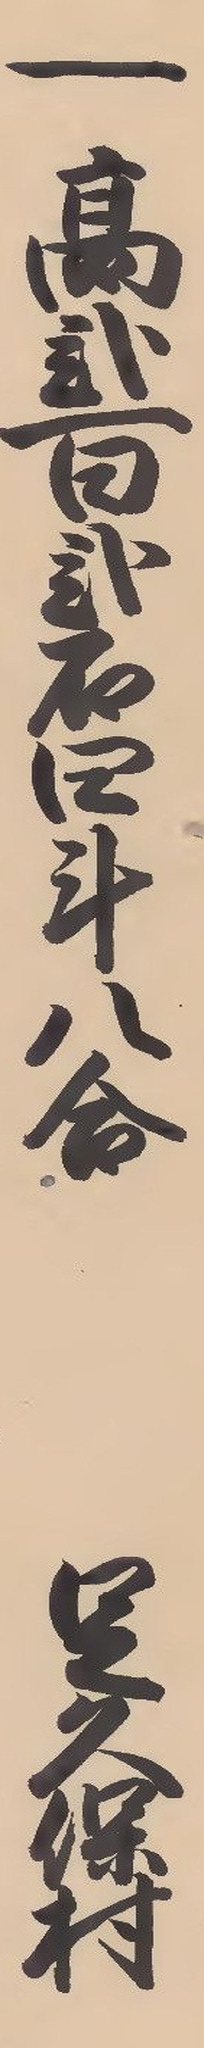一高弐百弐石四斗八合足久保村
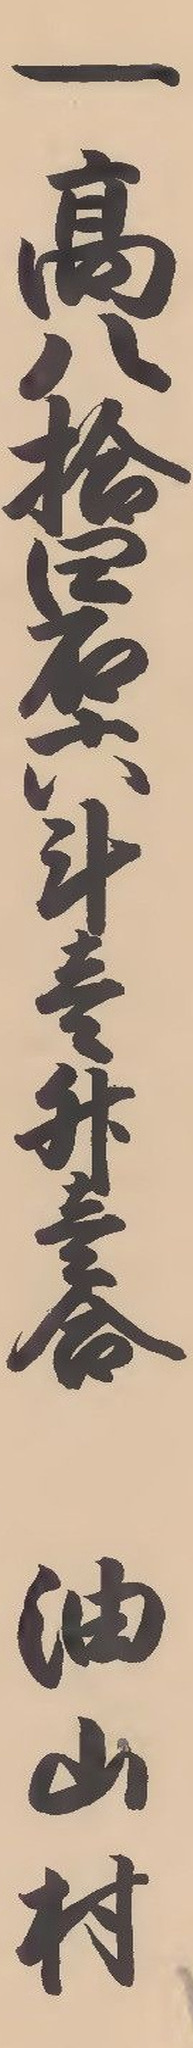一高八拾四石六斗壱升壱合油山村
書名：駿河国郷帳
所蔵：国立公文書館 National Archives of Japan
